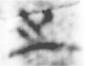之
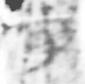革
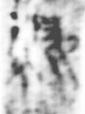綏
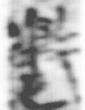○（衡）
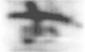戹（軛）
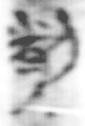削
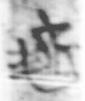○（鞍）
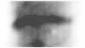一
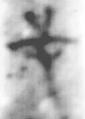矢
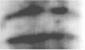二
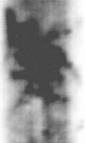秉
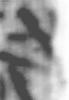又
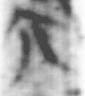六
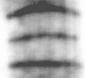三
